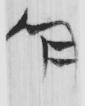今
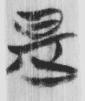是
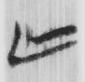亡
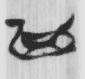𠀠
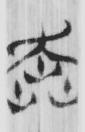奔
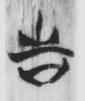告
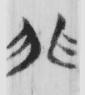非
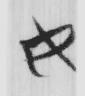女
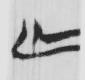亡
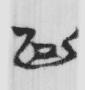𠀠
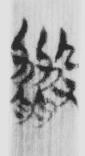{力肉力肉攴}
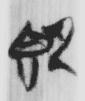即
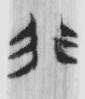行
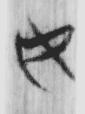女
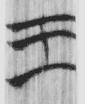王
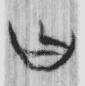曰
